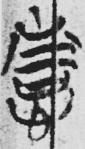情
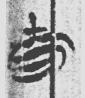冬（终）
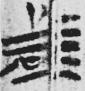者
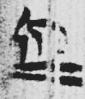近
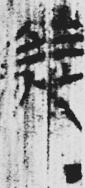義
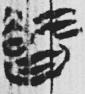智（知）
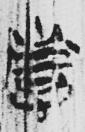情
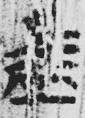者
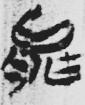能
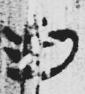出
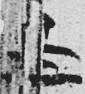之
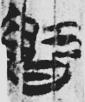智（知）
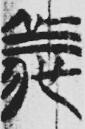義
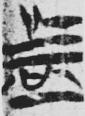者
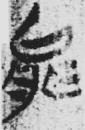能
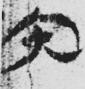内（入）
